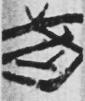武
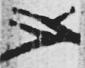之
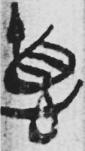惪（德）
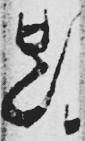也
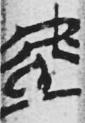○（吾）
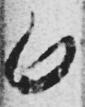㠯（以）
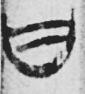甘
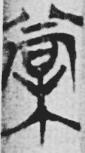棠
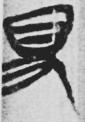○（得）
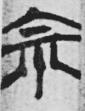宗
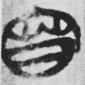○（廟）
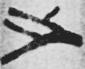之
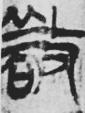敬
